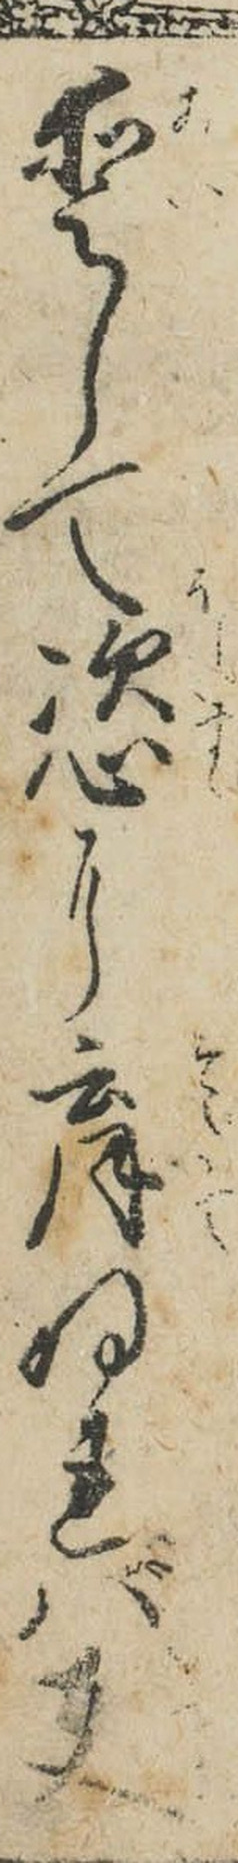愛して恣に育ぬれば夫

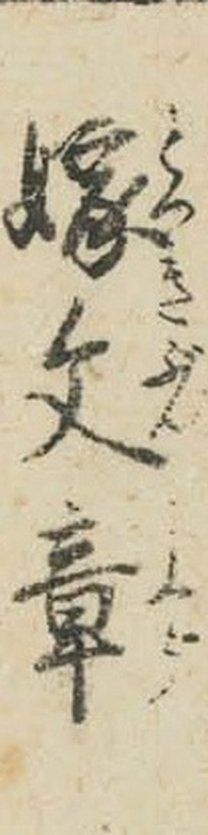嫁文章
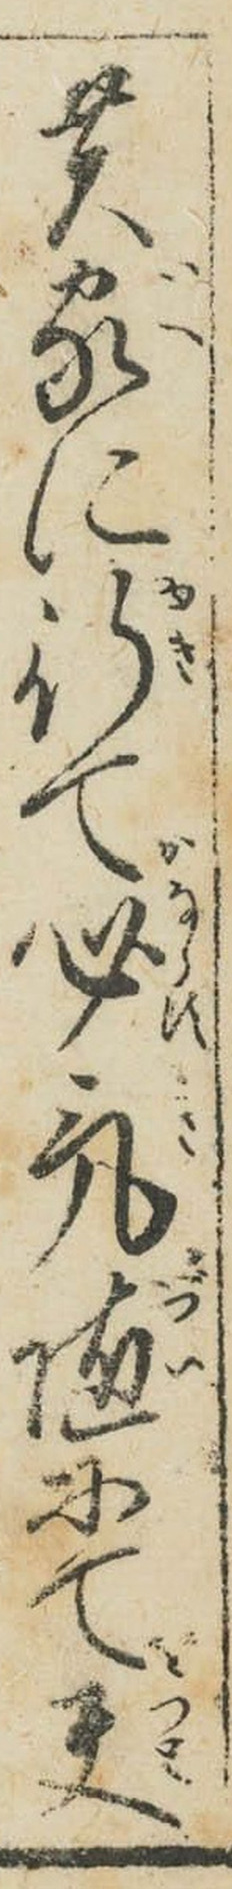の家に行て必気随にて夫
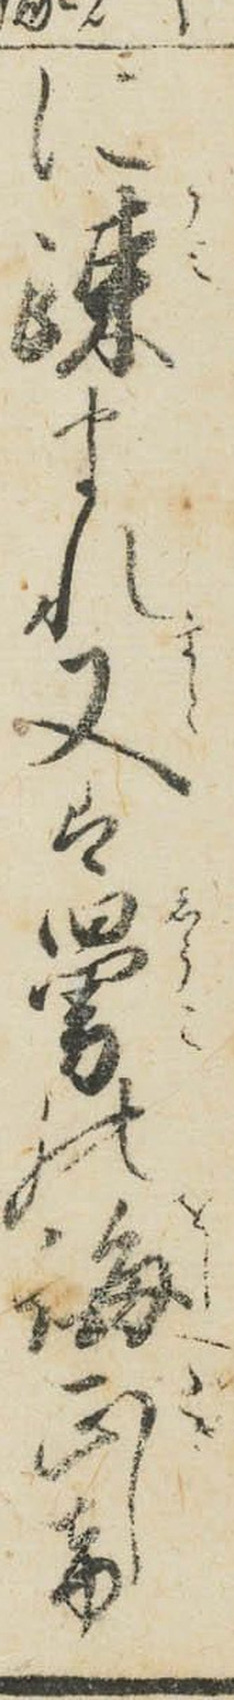に疎まれ又は舅の誨正しけ
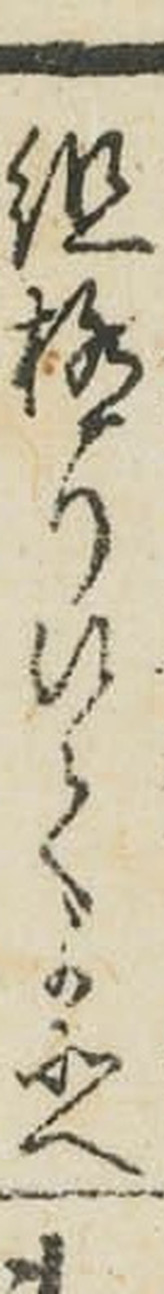組極り候てよ所へ
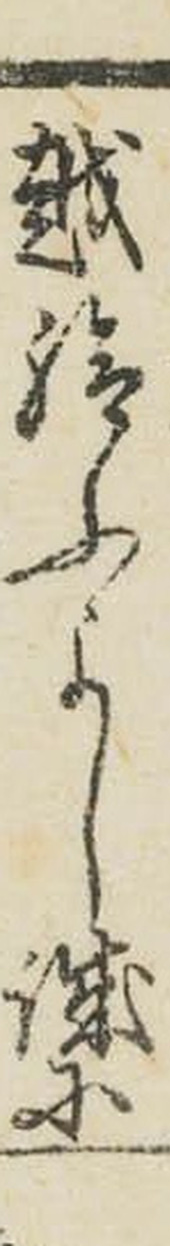越給ふよし誠に
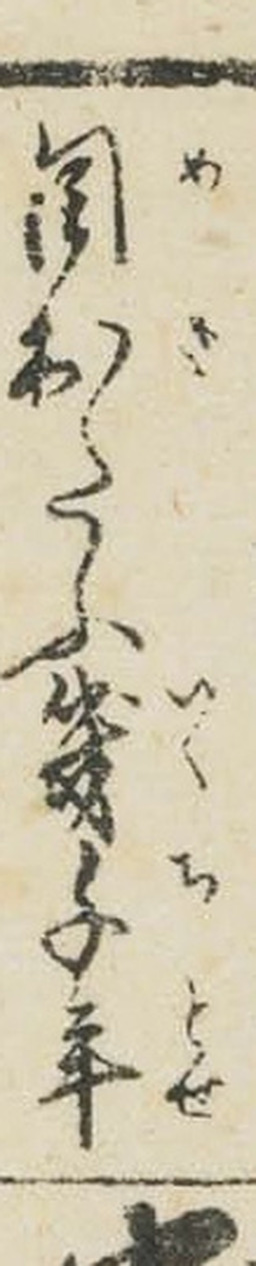目出たふ幾千年
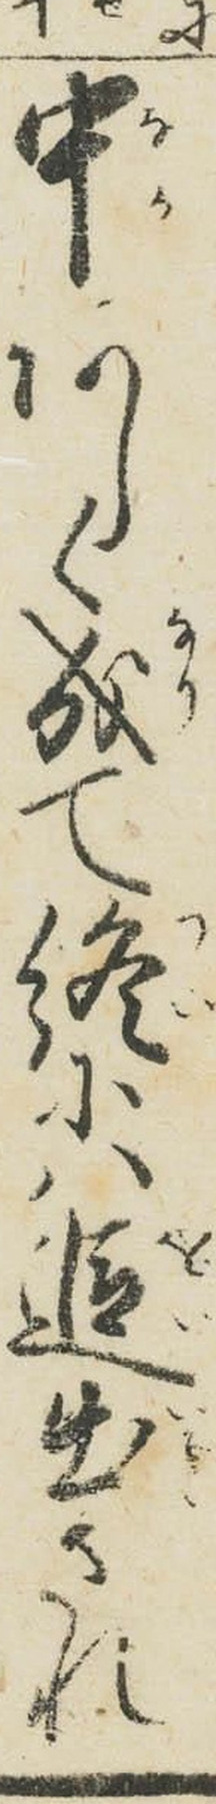中あしく成て終には追出され
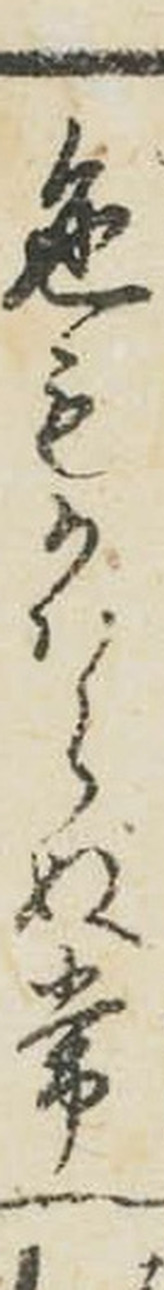色もかはらぬ常
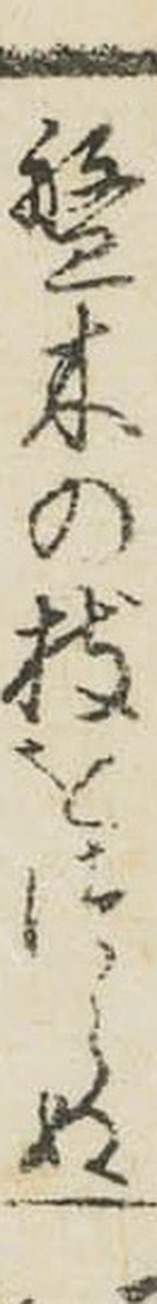盤木の枝をつらぬ
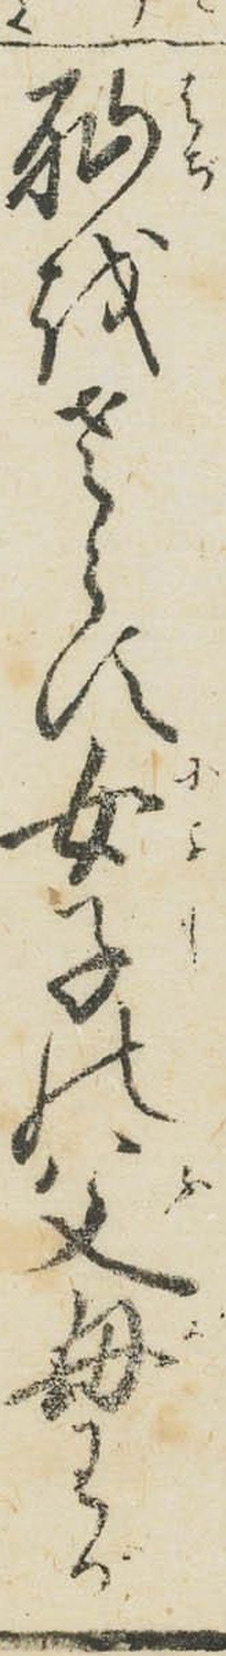恥をさらす女子の父母わが
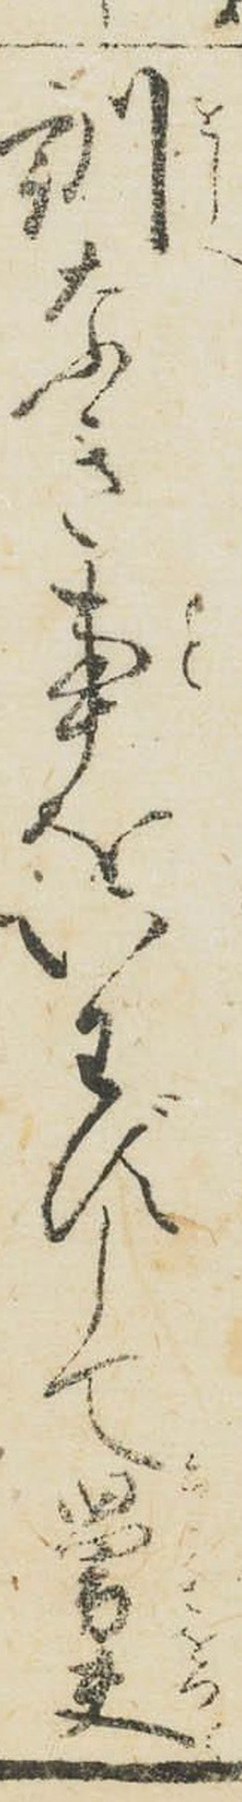訓なき事をいわずして舅夫
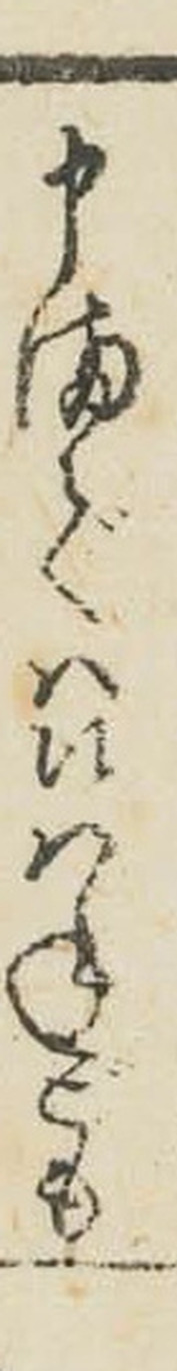申までは候はねども
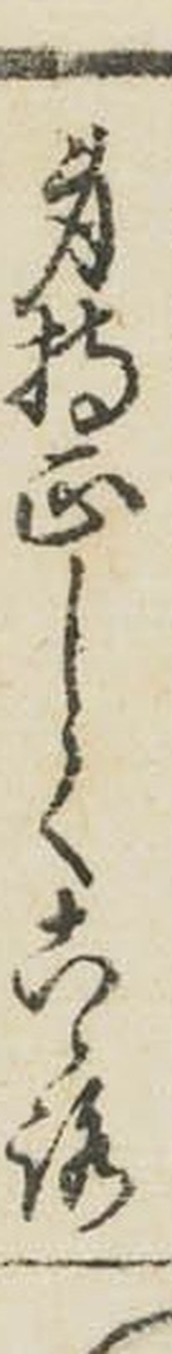身持正しくこゝろ
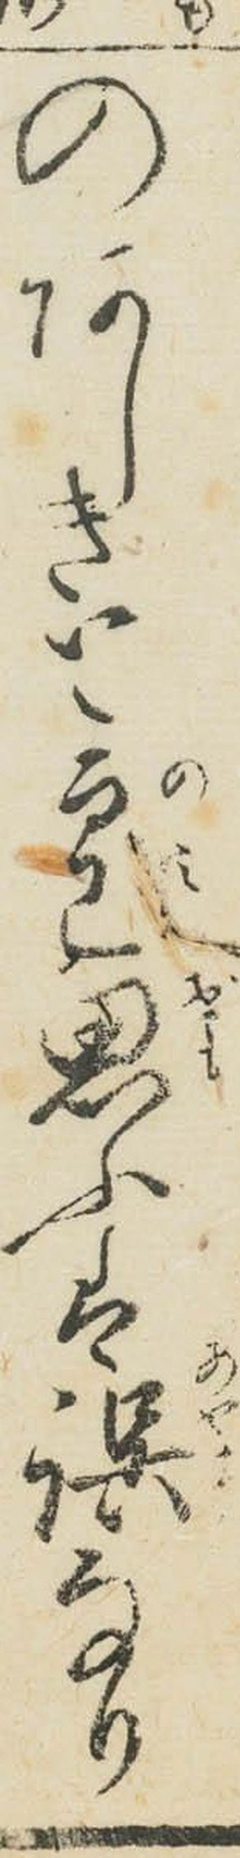のあしきと而已思ふは誤なり
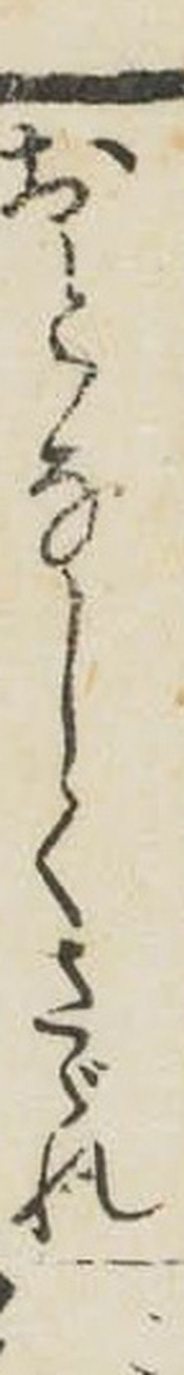おとなしくさゞれ
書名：女大学
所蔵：東京学芸大学教育コンテンツアーカイブ
